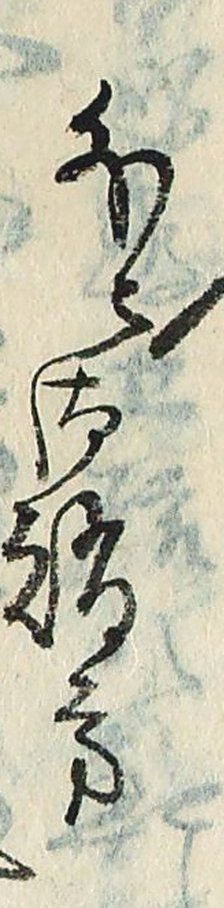外に御賄方
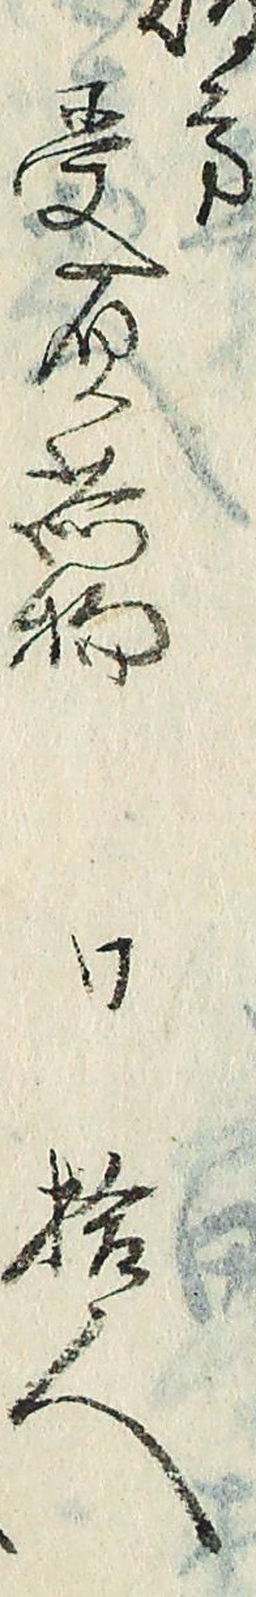受負荷物同拾人
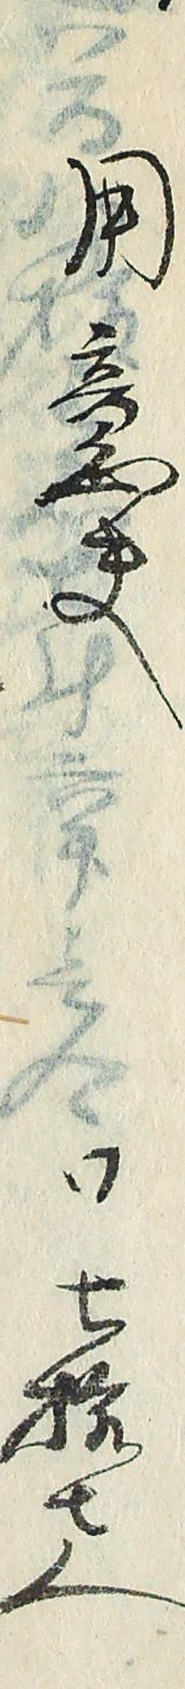同用意夫同七拾七人
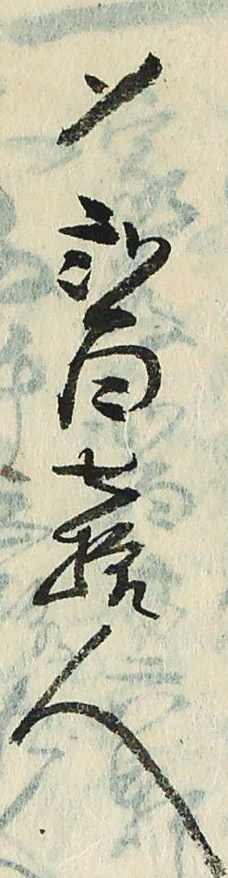〆弐百七拾人
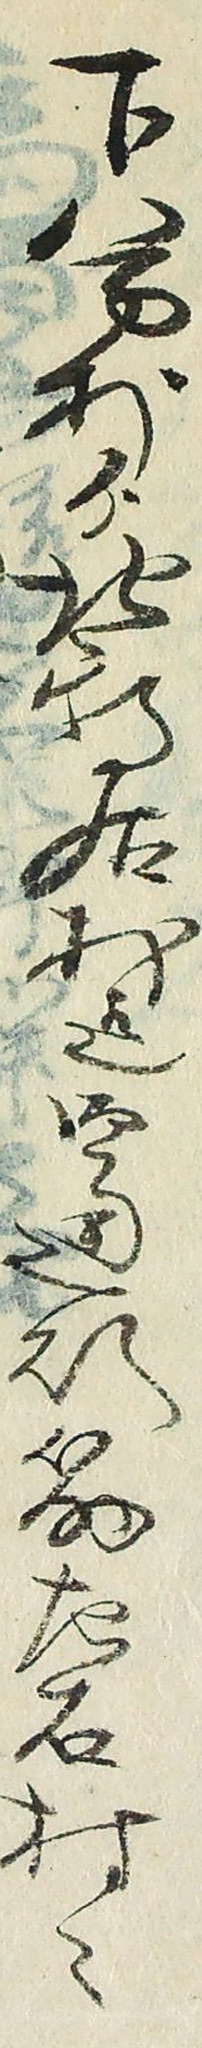下八万村ゟ北新居村迄御通行筋左右村々
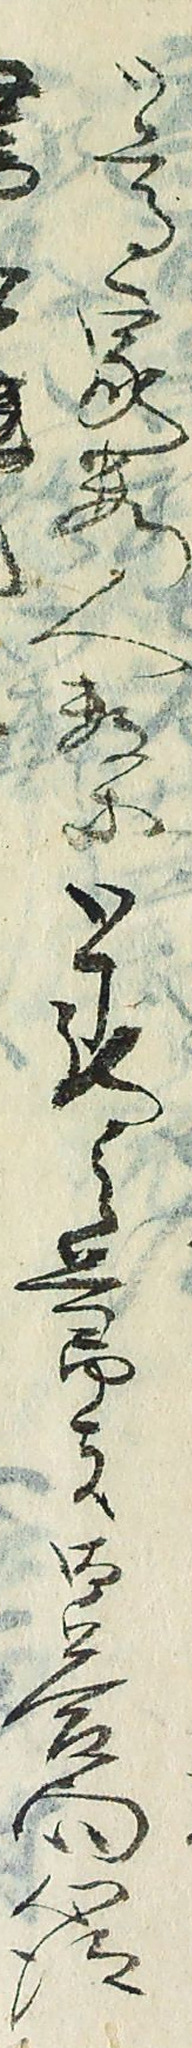御高家数人数等御尋之節は御答向心得
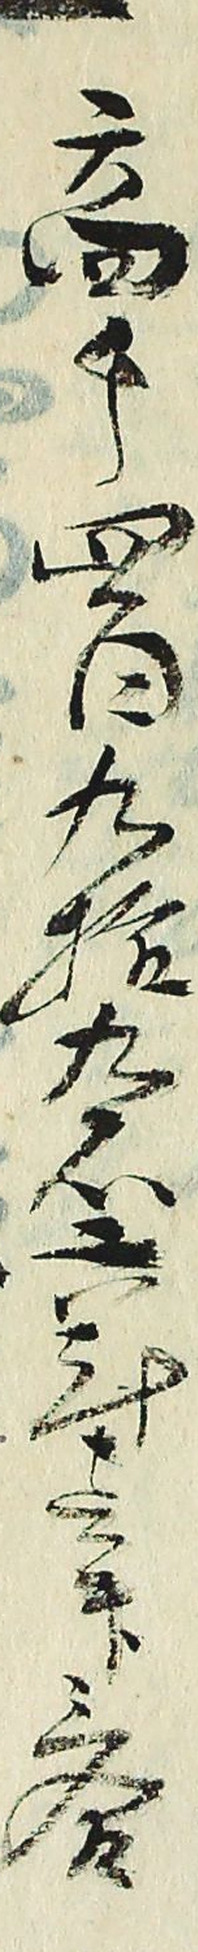高千四百九拾九石六斗壱升三合
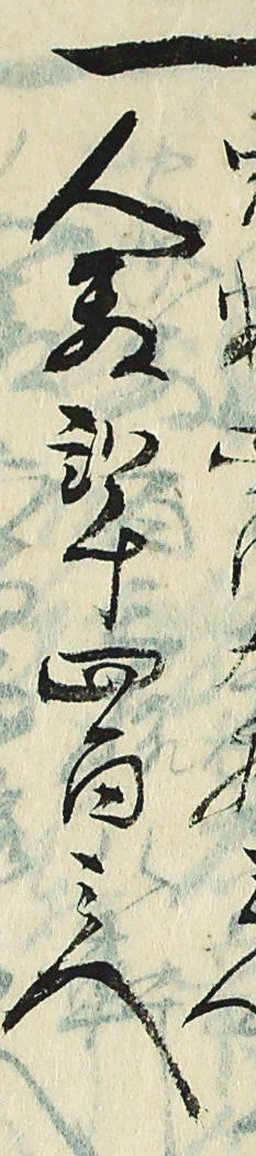人数弐千四百三人
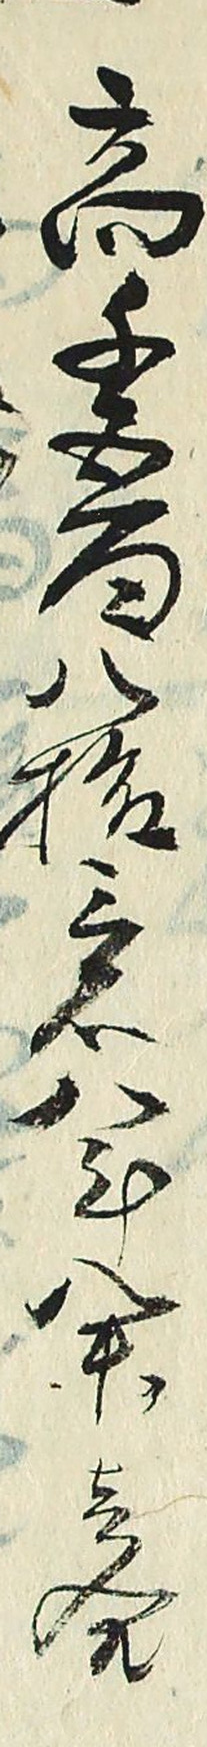高千五百八拾三石八斗八升壱合
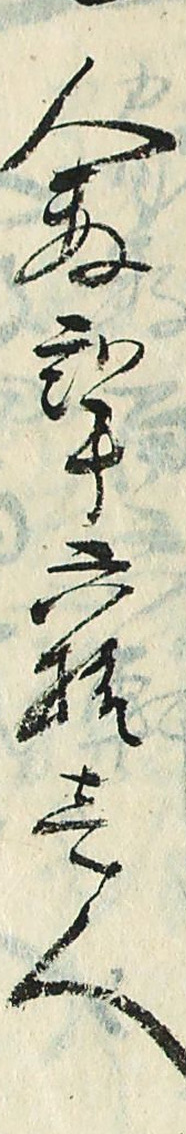人数弐千六拾壱人

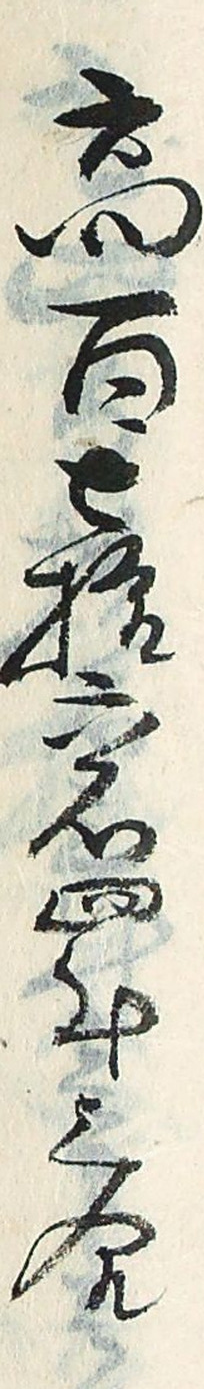高百七拾六石四斗三合
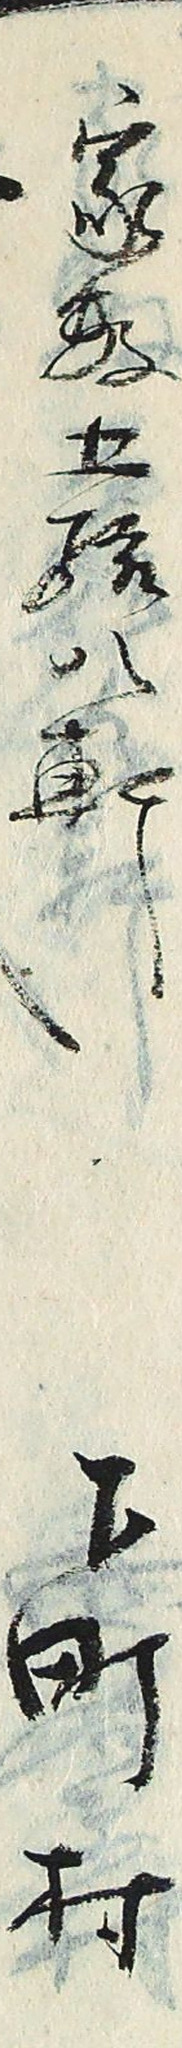家数五拾八軒下町村
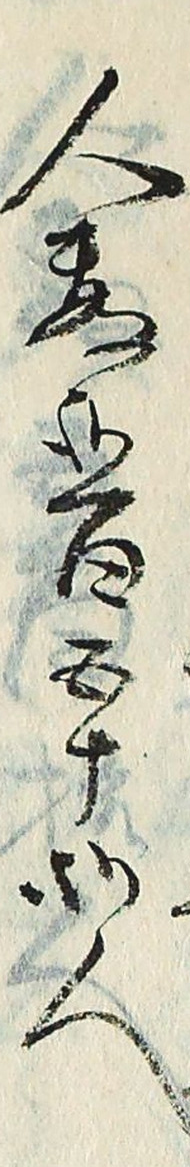人数弐百五拾弐人
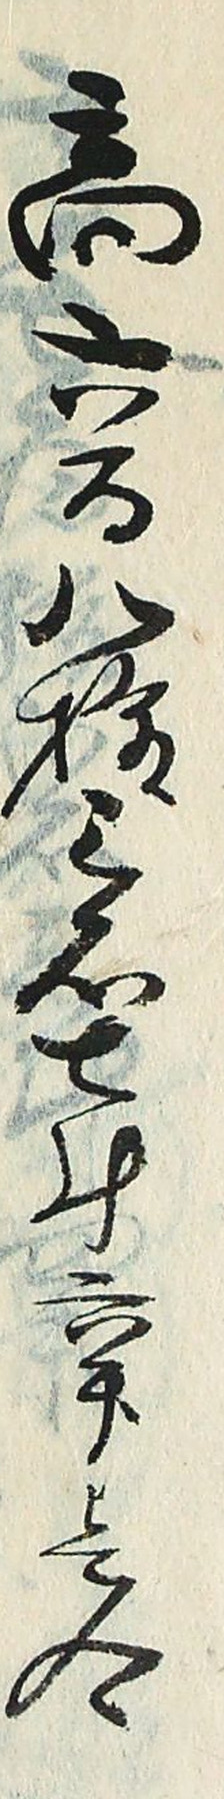高六百八拾三石七斗六升壱合
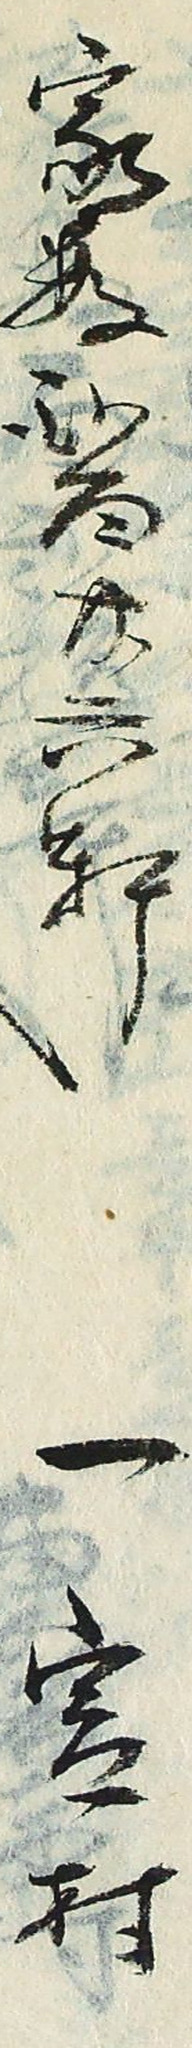家数弐百廿六軒一宮村
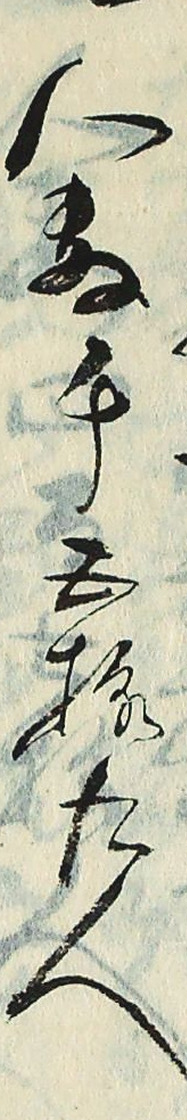人数千五拾九人
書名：公辺御役人為御廻浦御立越諸御用一巻
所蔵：鳴門教育大学 Naruto University of Education
